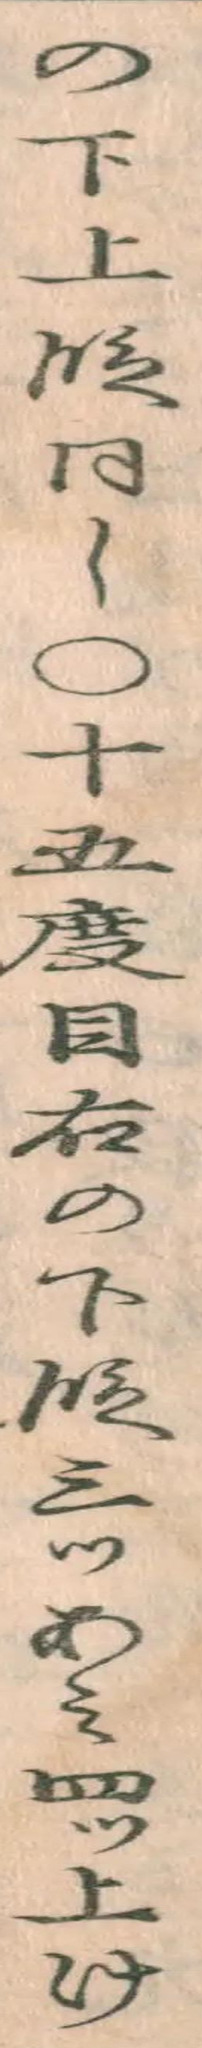の下上段同し○十五度目右の下段三ッあみ四ッ上け
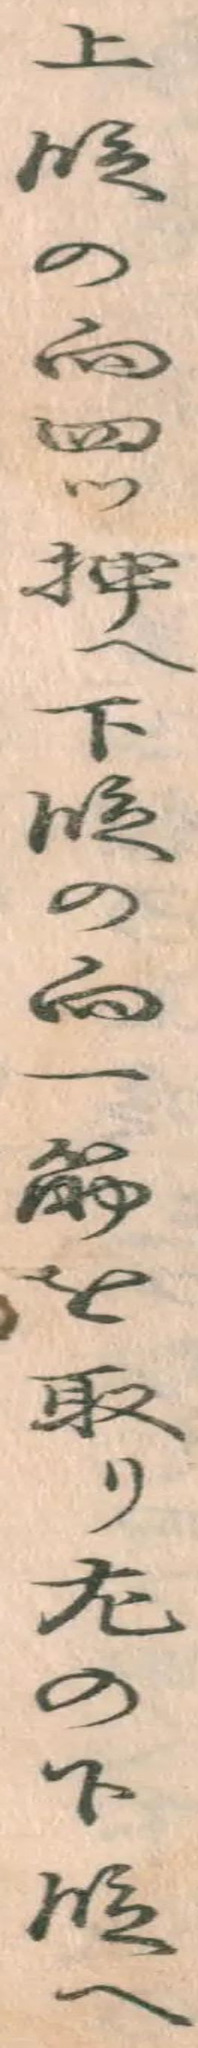上段の向四ッ押へ下段の向一筋を取り左の下段へ
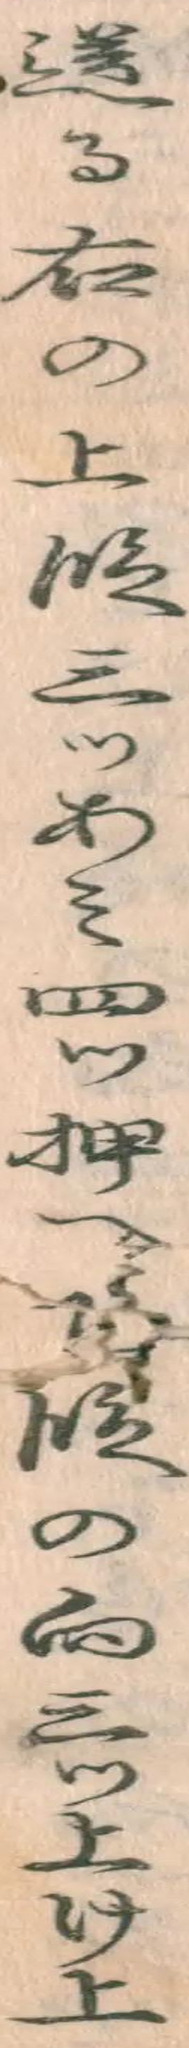送る右の上段三ッあみ四ッ押へ下段の向三ッ上け上
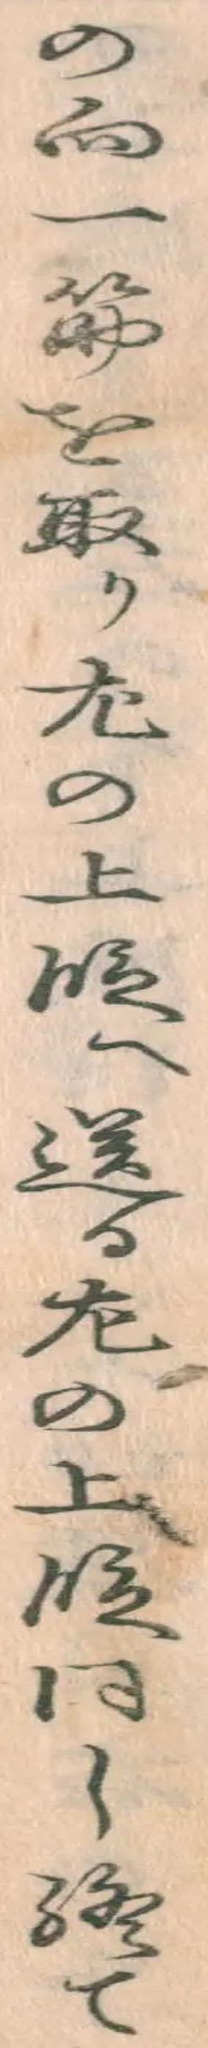の向一筋を取り左の上段へ送る左の上段同し終て
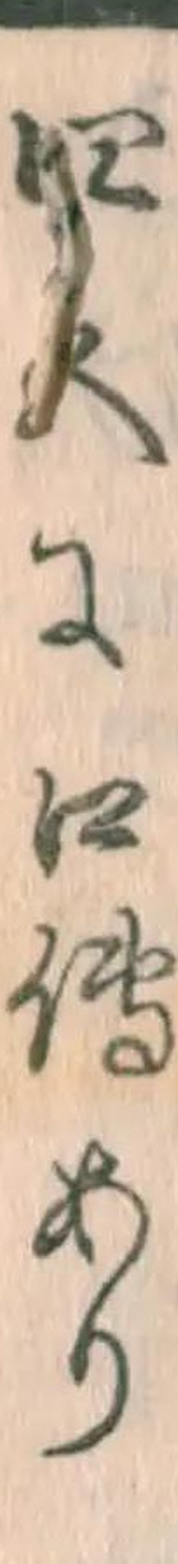四五に口伝あり
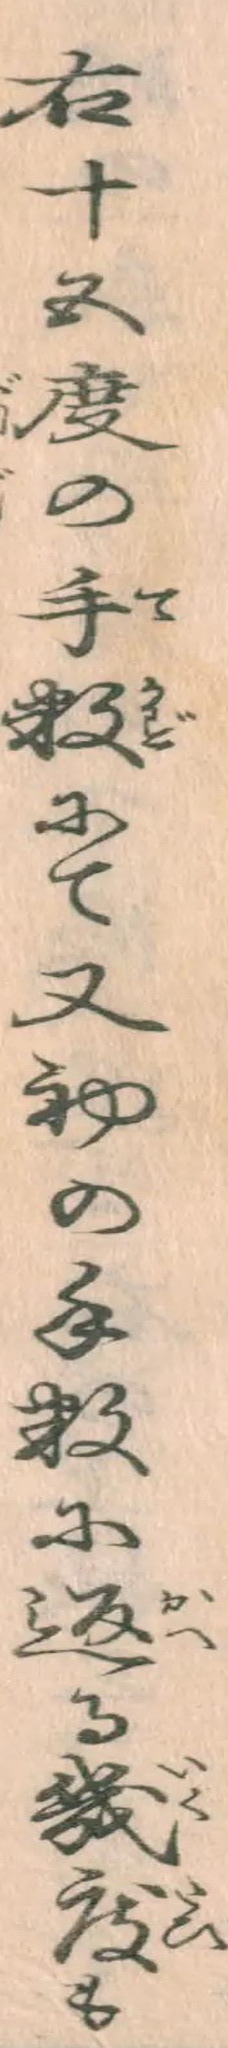一右十五度の手数にて又初の手数に返る幾度も
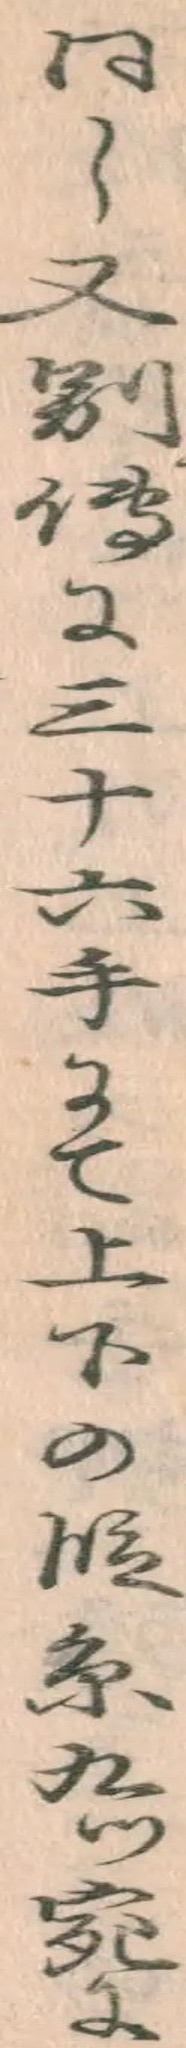同し又別伝に三十六手にて上下の段糸九ッ宛に
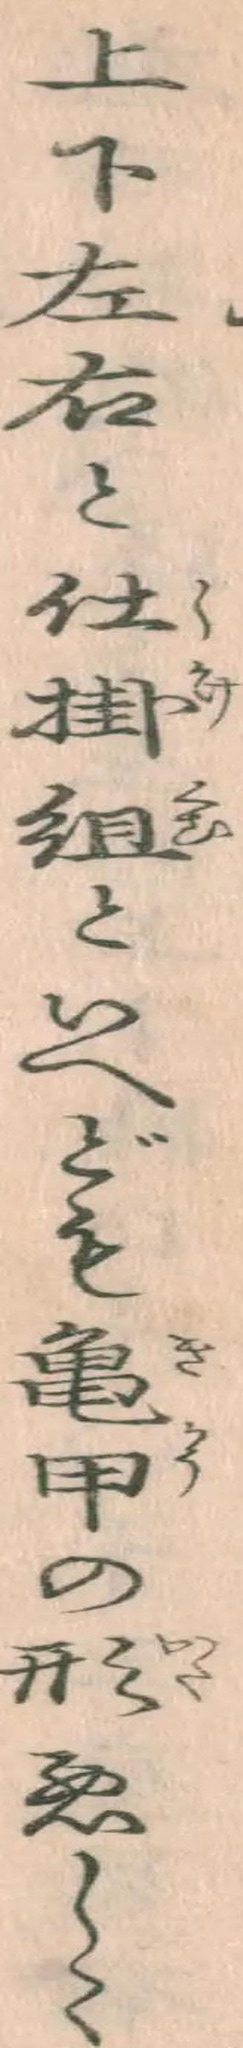上下左右と仕掛組といへども亀甲の形悪しく
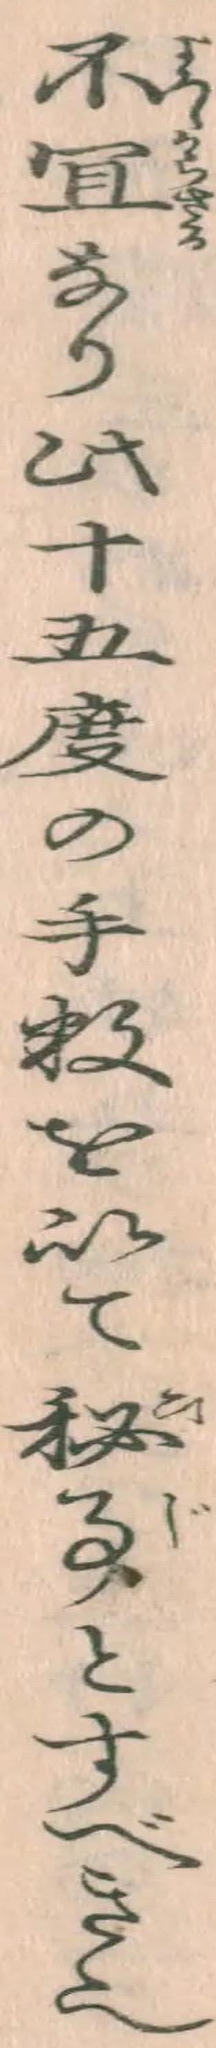不宜なり此十五度の手数を以て秘事とすべき也
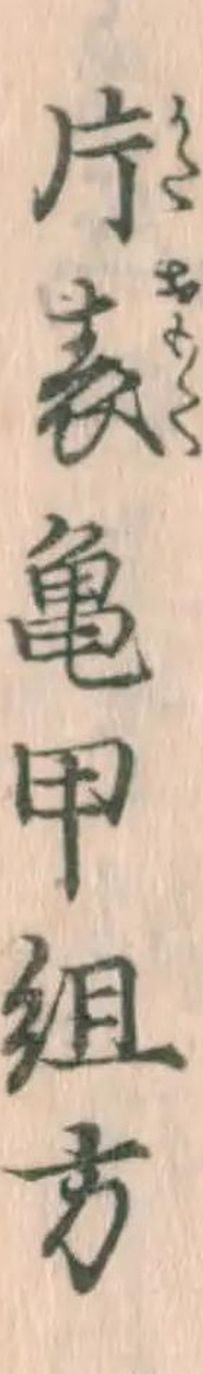片表亀甲組方
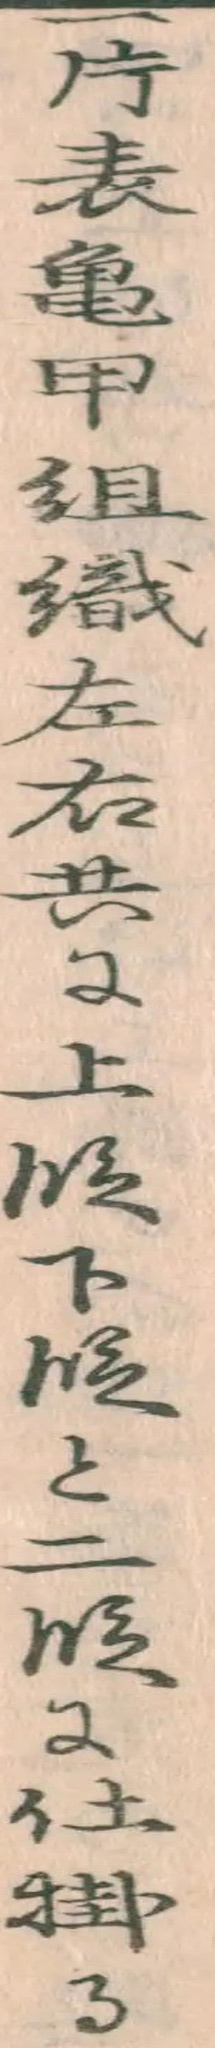一片表亀甲組織左右共に上段下段と二段に仕掛る
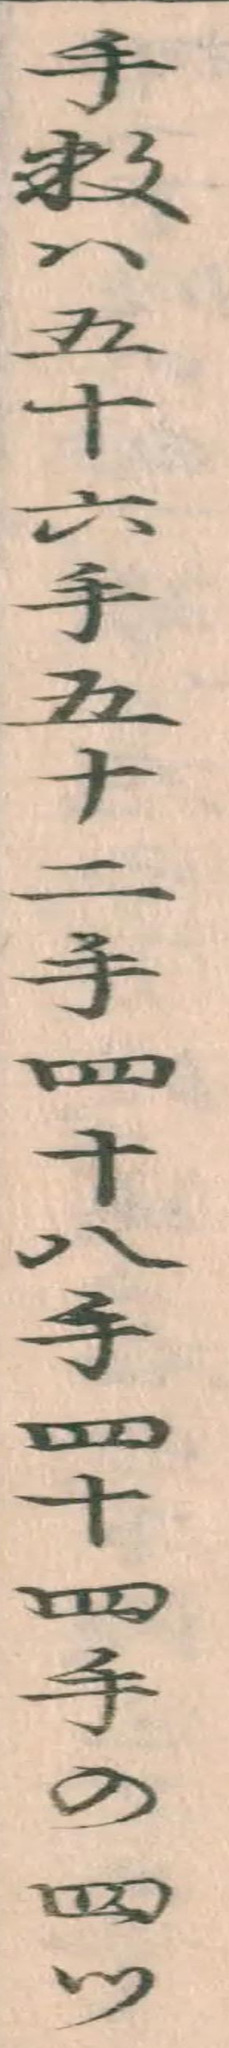手数は五十六手五十二手四十八手四十四手の四ッ
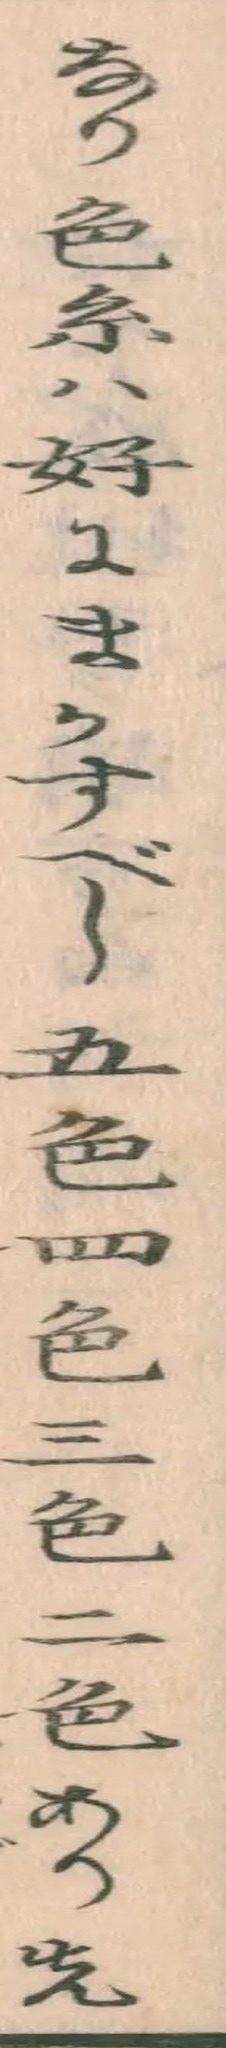なり色糸は好にまかすべし五色四色三色二色あり先
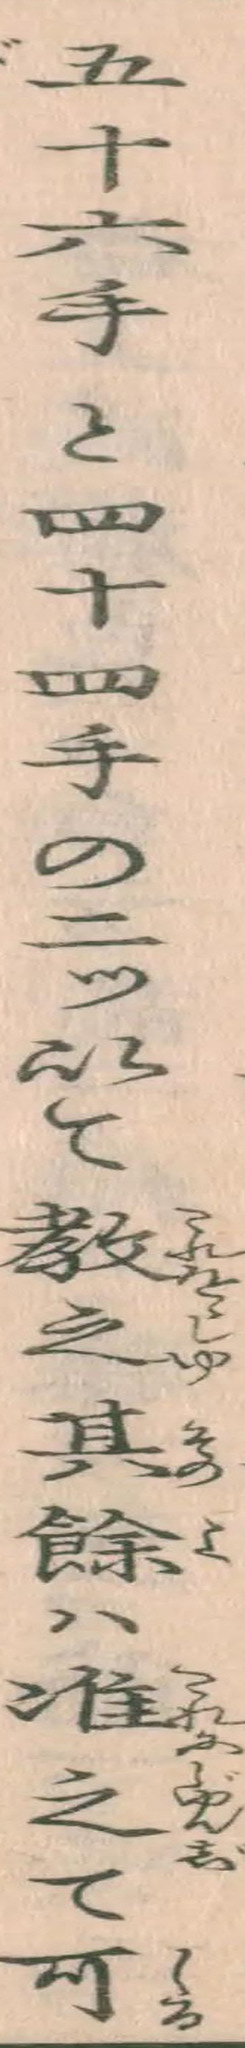五十六手と四十四手の二ッ以て教之其余は准之て可
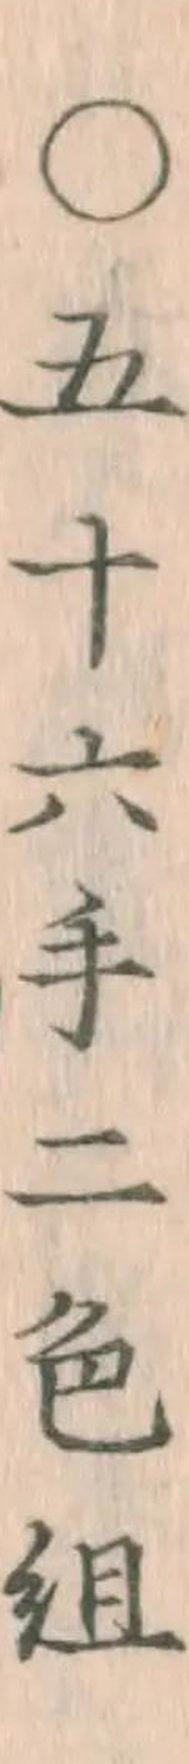○五十六手二色組
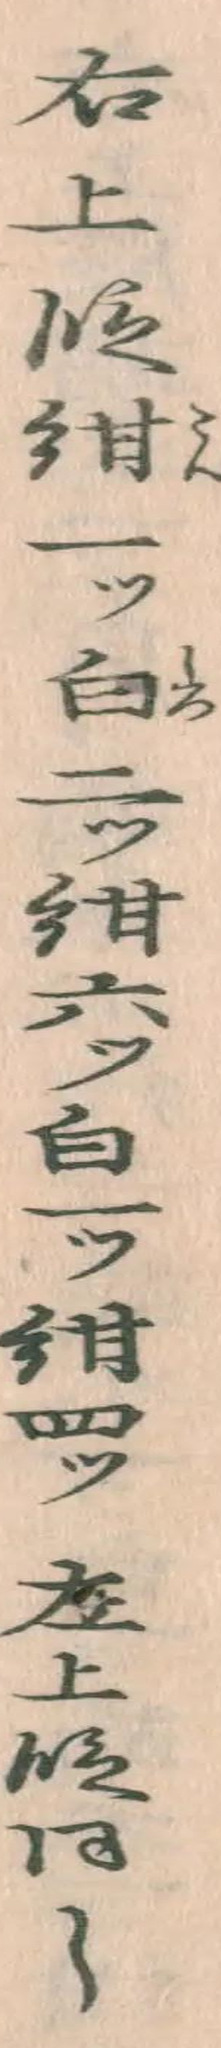右上段紺一ッ白二ッ紺六ッ白一ッ紺四ッ左上段同し
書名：機織彙編 5巻. [2]
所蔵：国立国会図書館 National Diet Library, JAPAN
